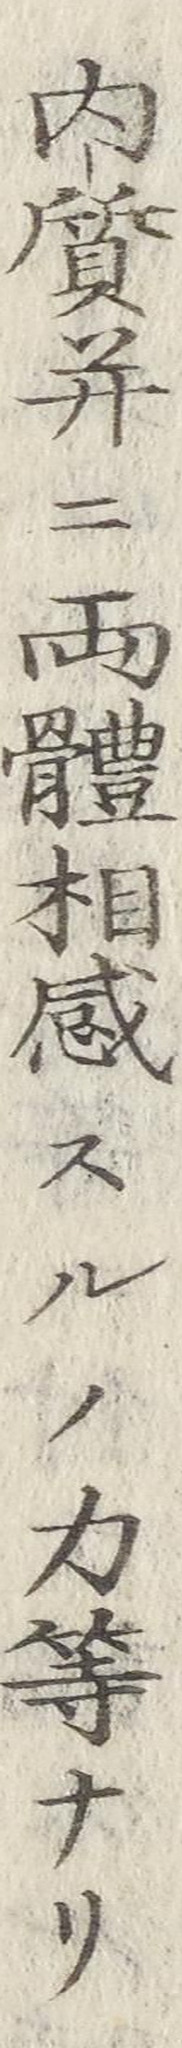内-質幷ニ両体相感スルノ力等ナリ
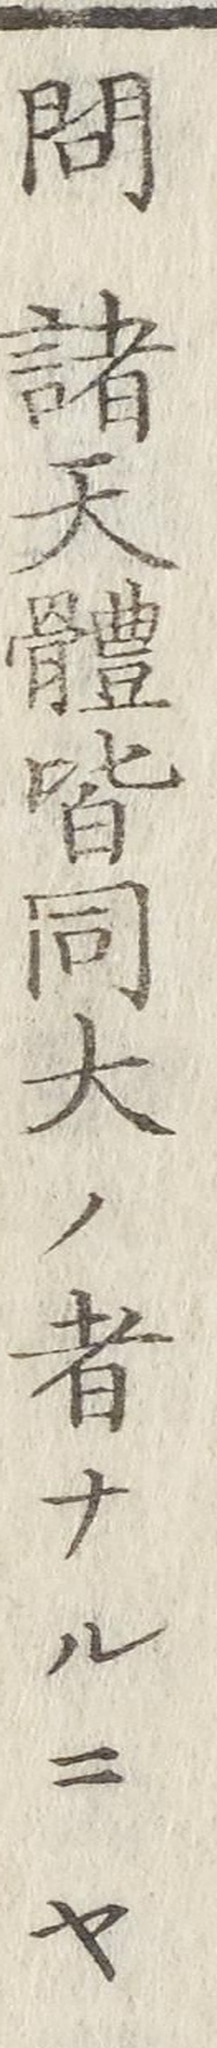問諸天体皆同大ノ者ナルニヤ
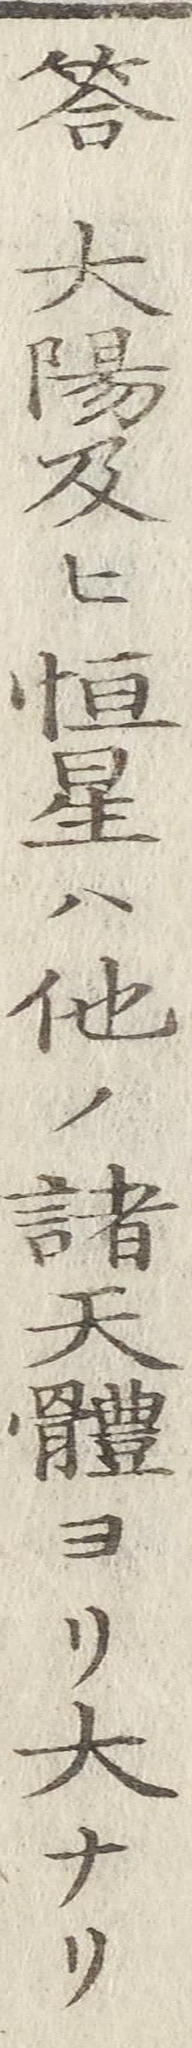答大陽及ヒ恒星ハ他ノ諸天体ヨリ大ナリ
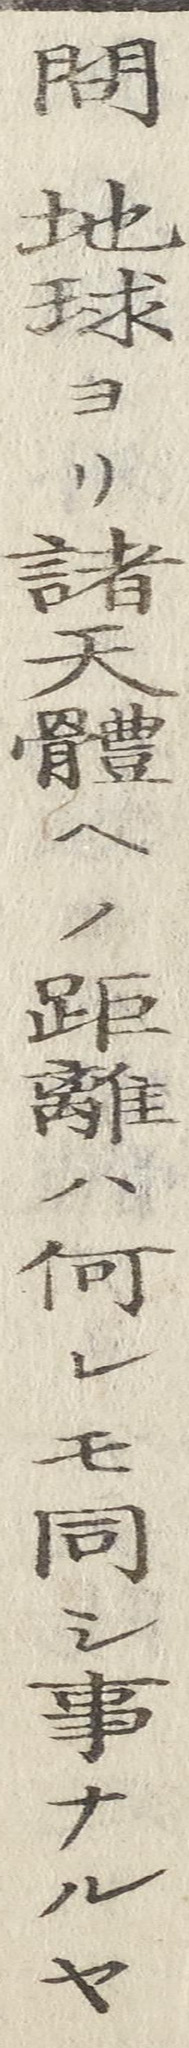問地球ヨリ諸天体ヘノ距離ハ何レモ同シ事ナルヤ
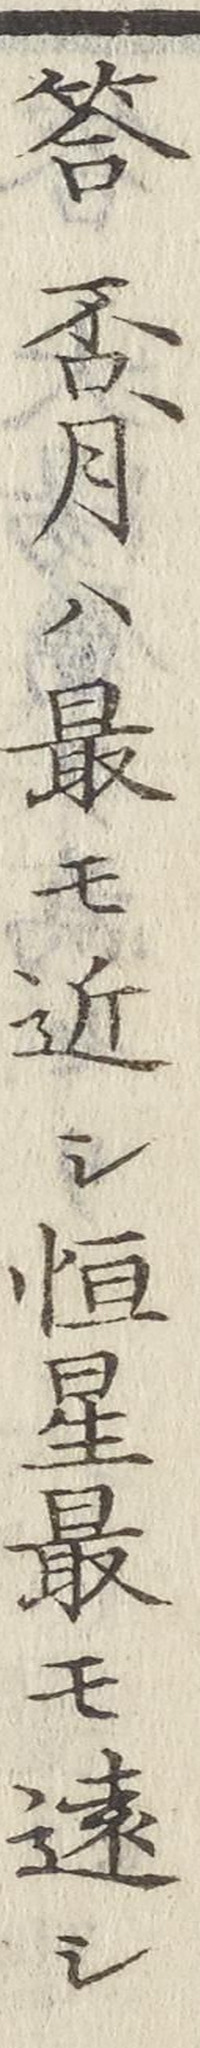答否月ハ最モ近シ恒星最モ遠シ
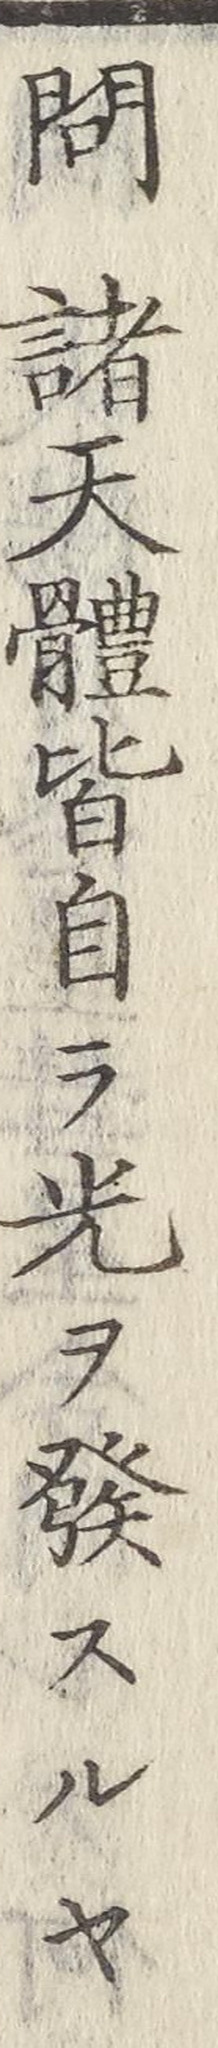問諸天体皆自ラ光ヲ発スルヤ
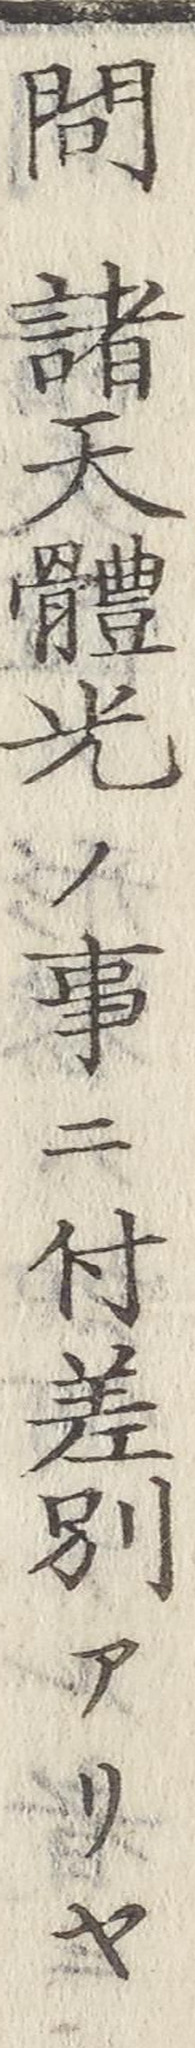問諸天体光ノ事ニ付差別アリヤ
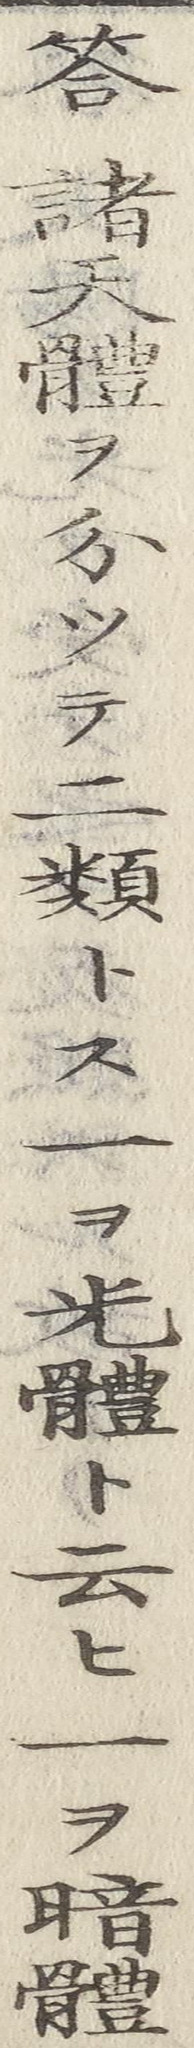答諸天体ヲ分ツテ二類トス一ヲ光体ト云ヒ一ヲ暗体
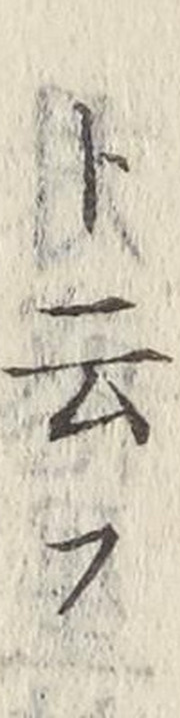ト云フ
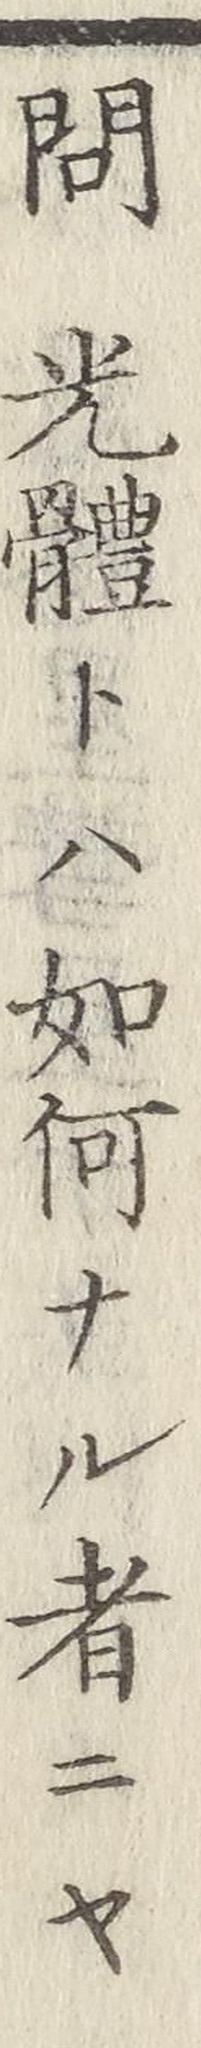問光体トハ如何ナル者ニヤ
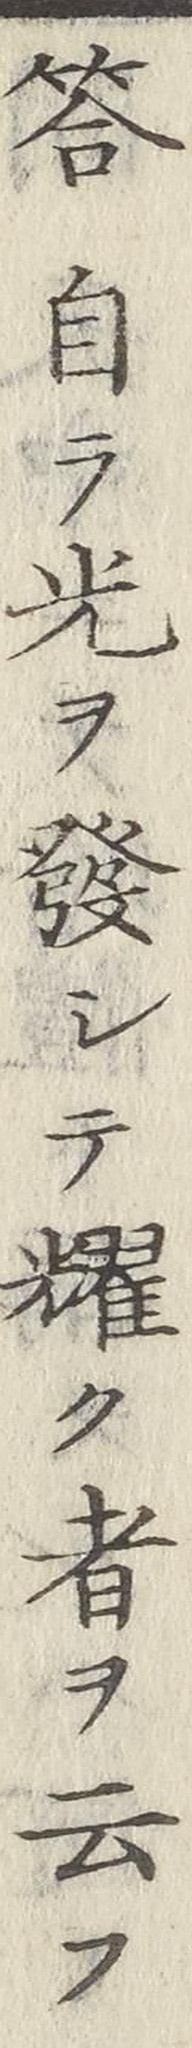答自ラ光ヲ発シテ耀ク者ヲ云フ
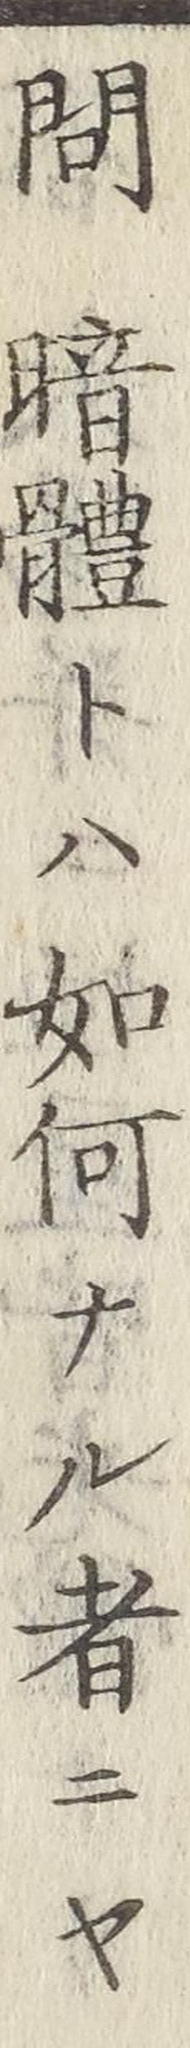問暗体トハ如何ナル者ニヤ
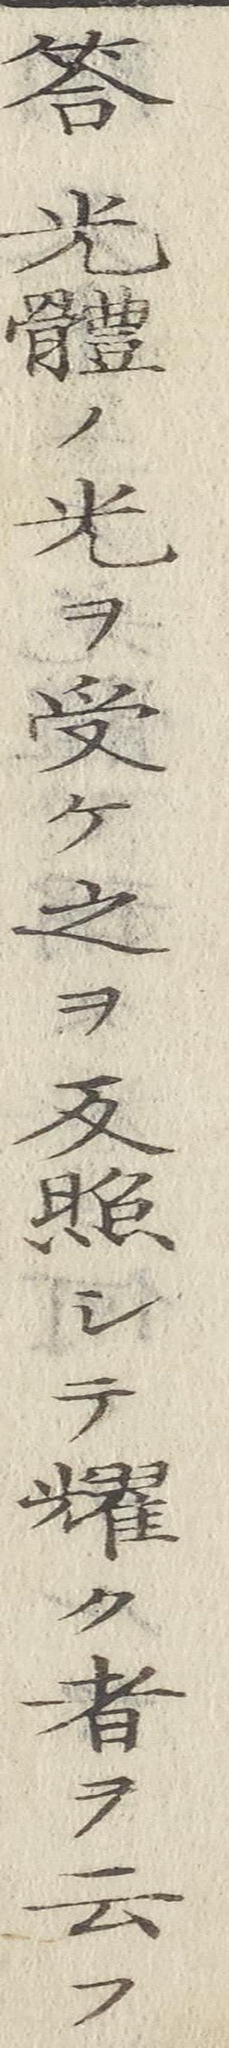答光体ノ光ヲ受ケ之ヲ反照シテ耀ク者ヲ云フ

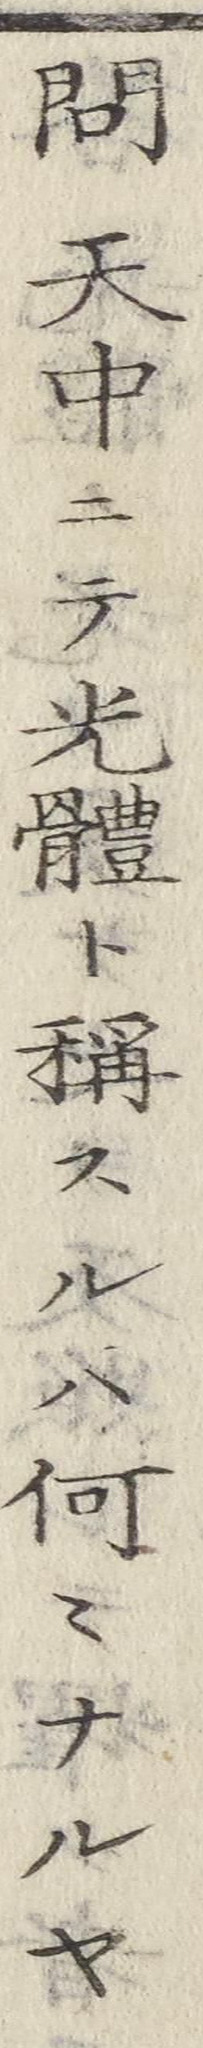問天中ニテ光体ト称スルハ何々ナルヤ
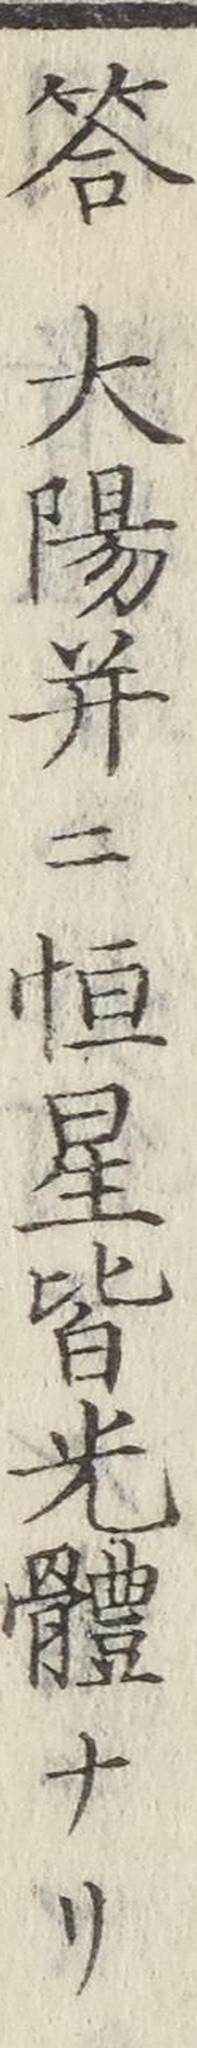答大陽幷ニ恒星皆光体ナリ
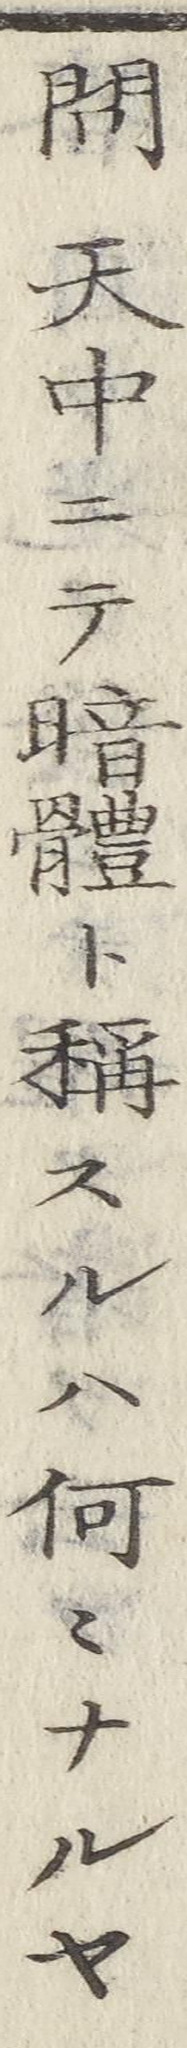問天中ニテ暗体ト称スルハ何々ナルヤ
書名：星学圖説　上
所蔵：東京大学地震研究所図書室 Earthquake Research Institute Library, The University of Tokyo, JAPAN
